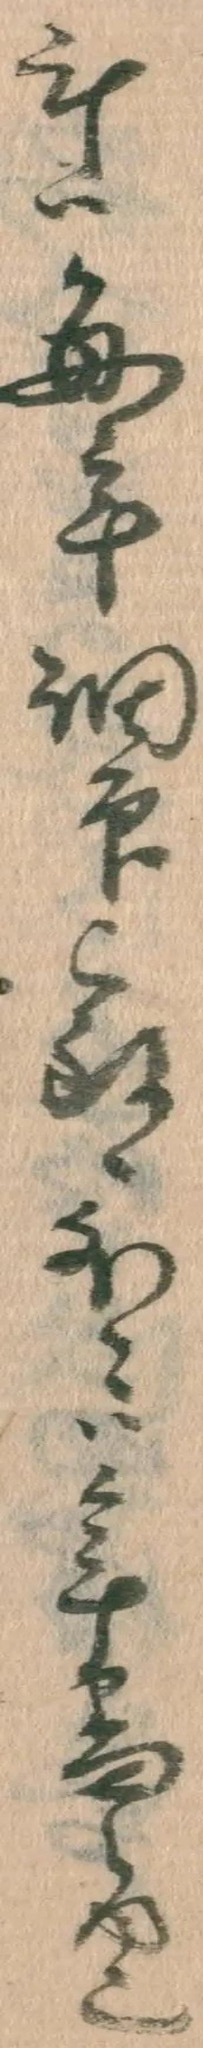計ハ毎年調印被致候外々ハ年番之内也
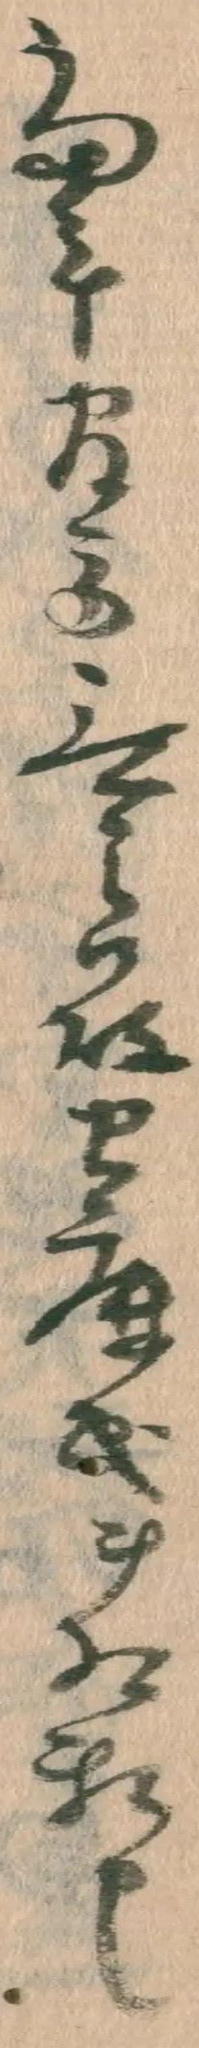当年官方無之候故鹿氏ヲ相頼申候
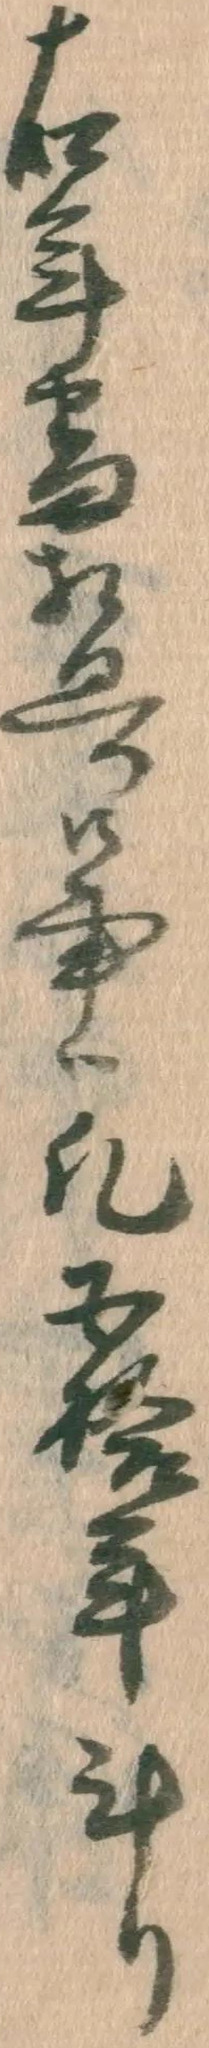右年番相廻り候事ハ凡五拾年計り
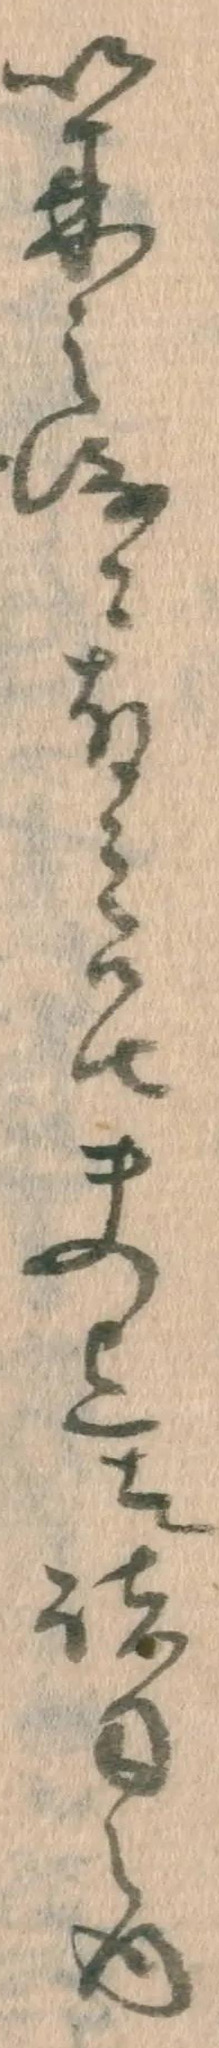以来之儀ニ有之候由夫迄者諸司之内
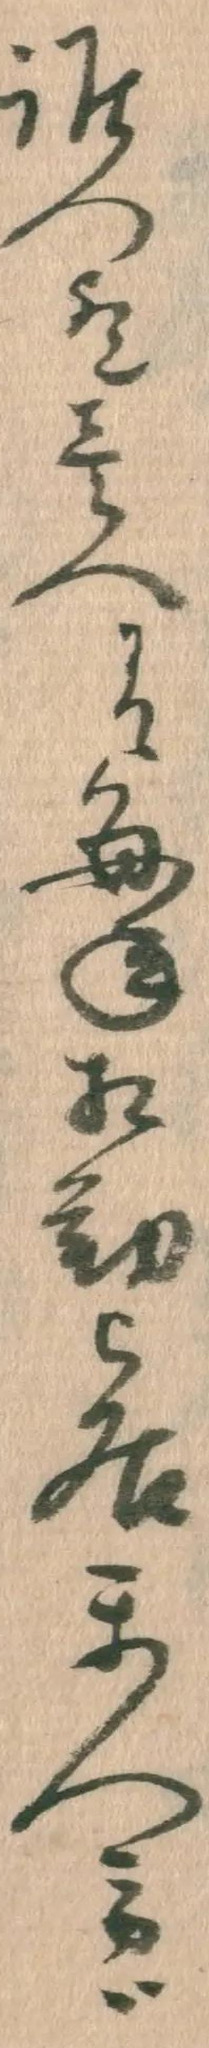誰人歟壱人にて毎年相勤被居楽人方ハ
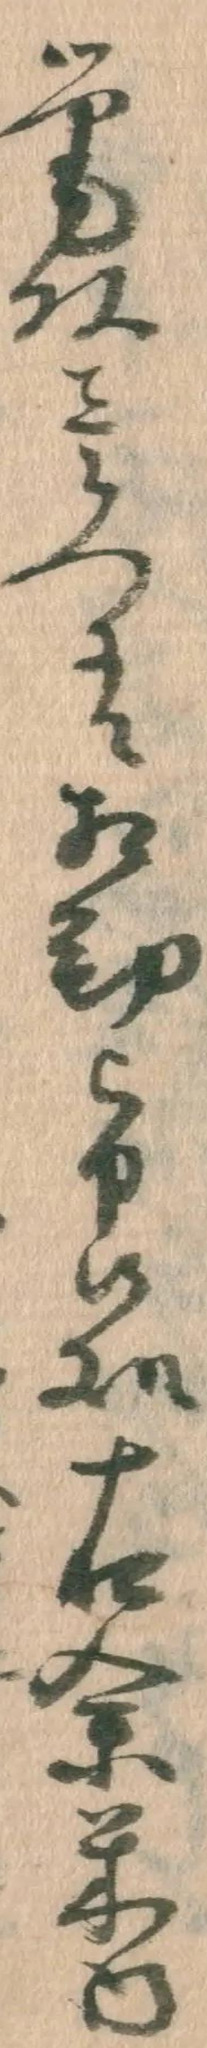筆頭壱人にて相勤被申候処右余米内
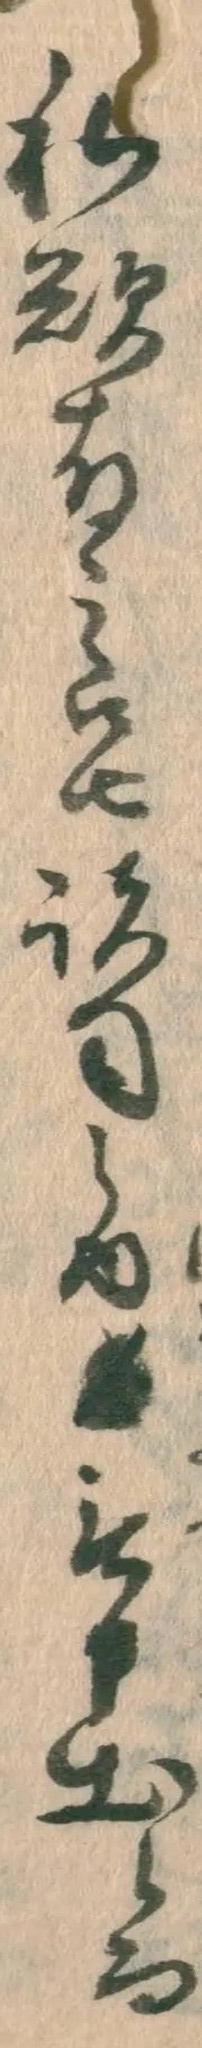私欲有之候由諸司之内ゟ被申出候而
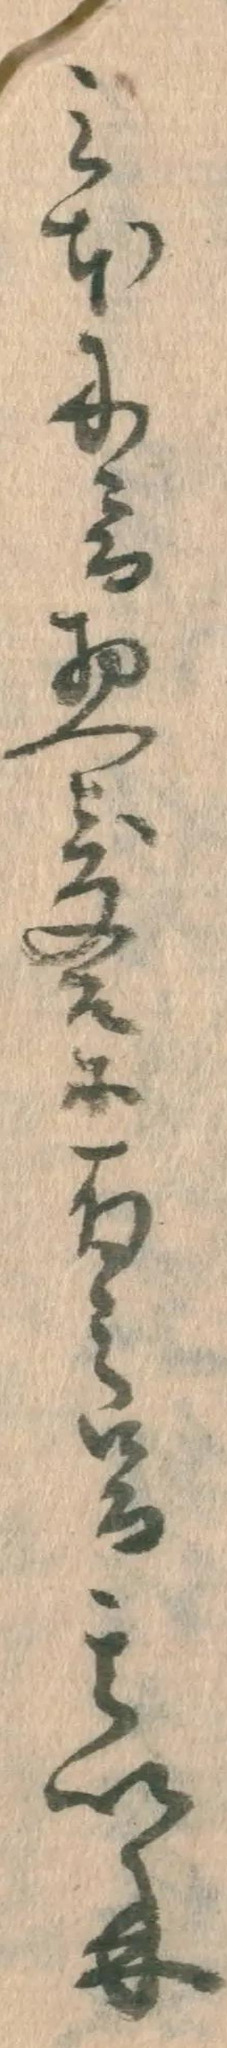三本木ニ而惣寄合等有之候而其以来
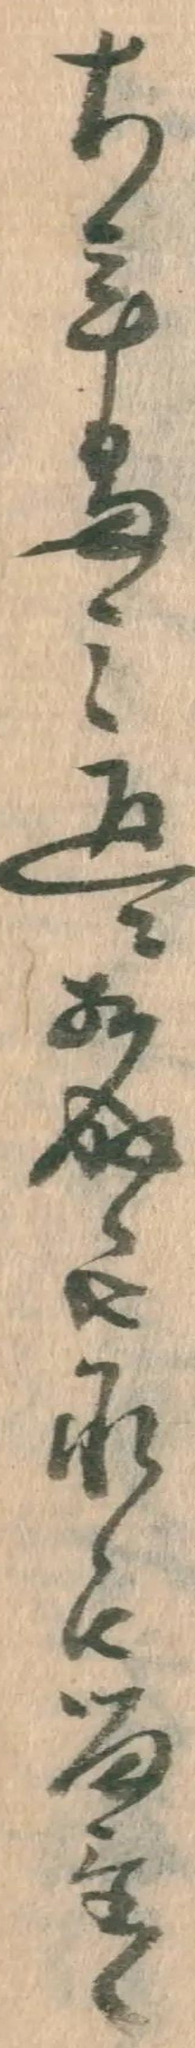右年番之通ニ相成候由承候由留置候

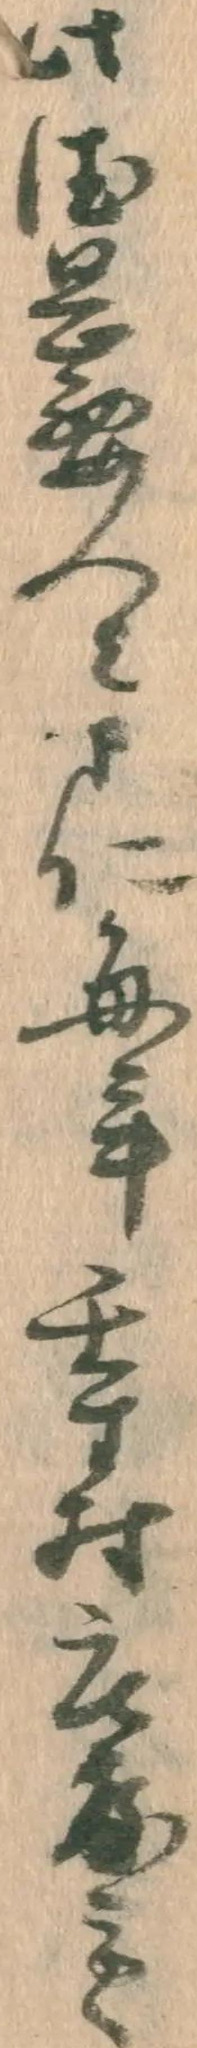此徳岡要人与申仁毎年壬生村庄屋方へ
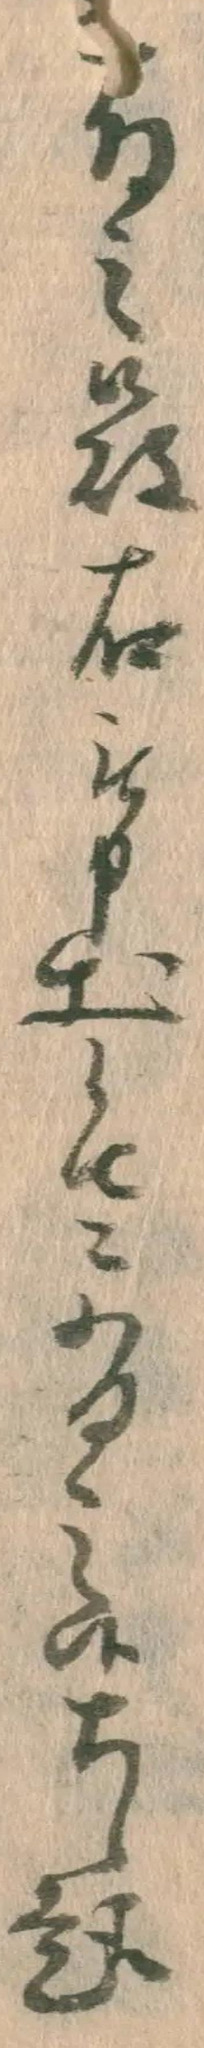有之候故右被申出候由ニ有之候右之趣
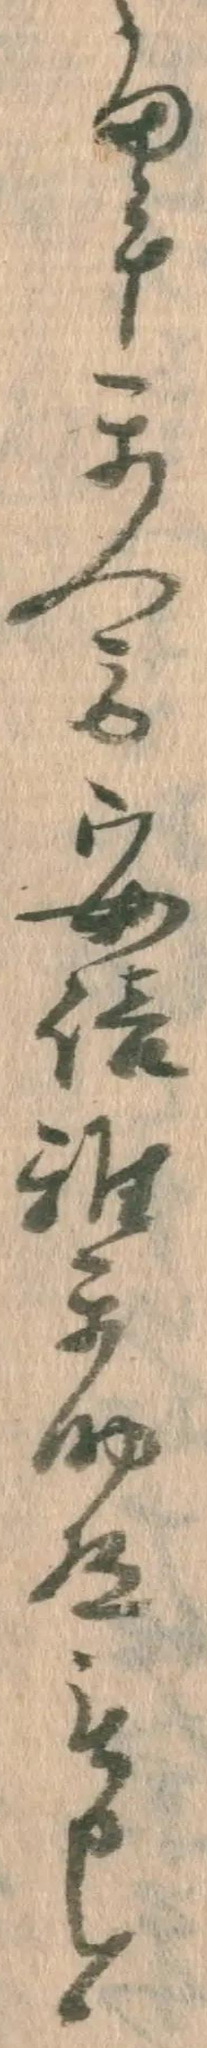当年楽人方安倍雅楽助殿被申候
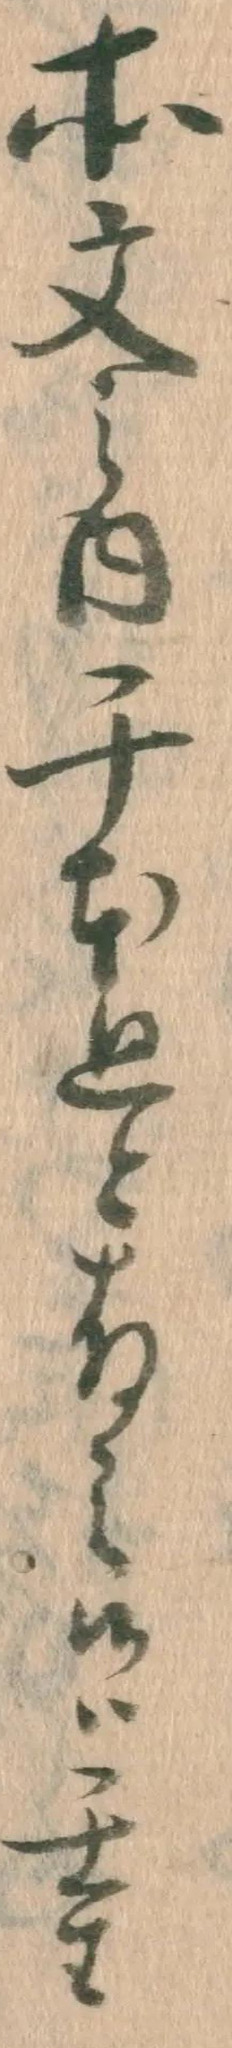本文之内千本廻と有之候ハ壬生
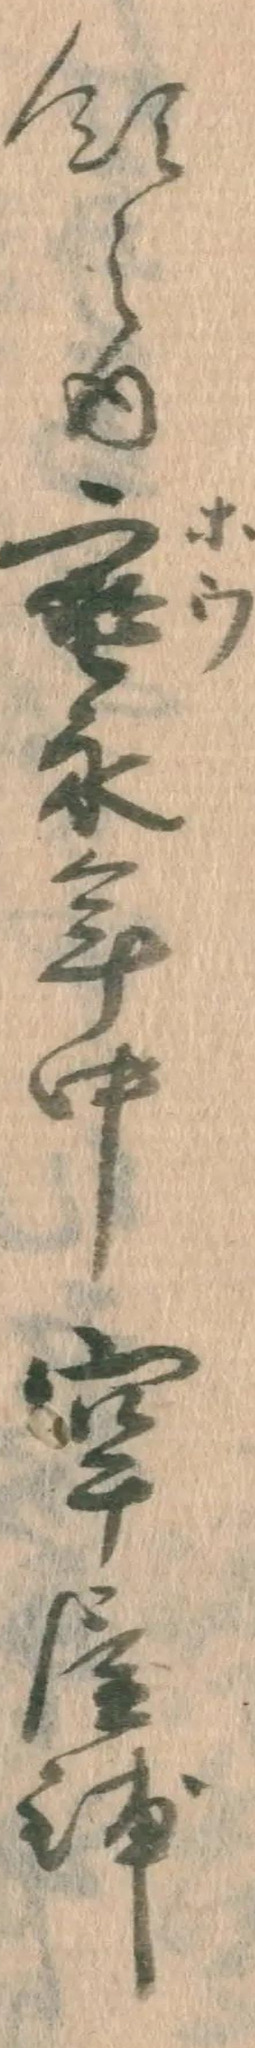領之内寶永年中牢屋鋪
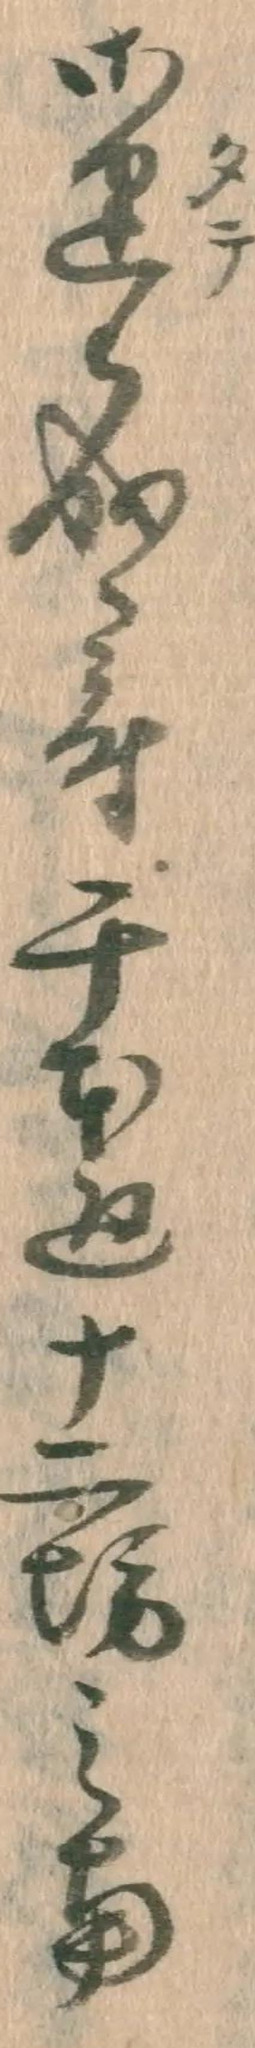御建被成候ニ付千本廻十二坊之南
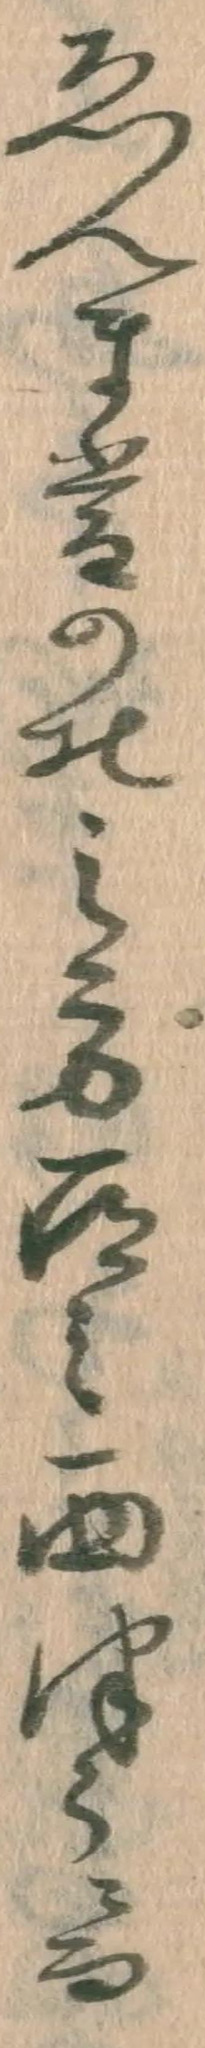ゑんま堂の北之方之西つらニ而
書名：賀茂社記録. 第61冊
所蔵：国立国会図書館 National Diet Library, JAPAN
